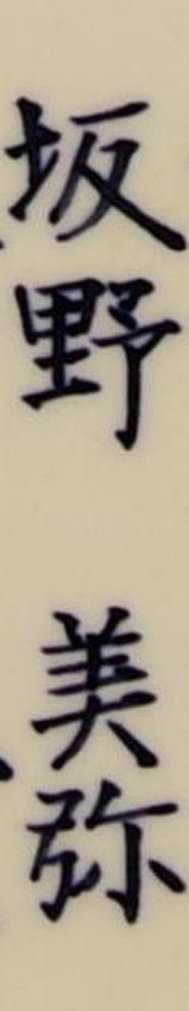坂野美弥
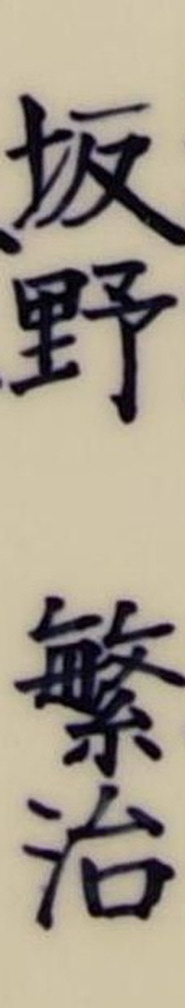坂野繁治
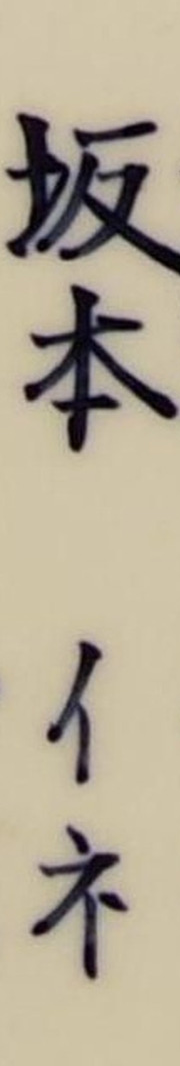坂本イネ
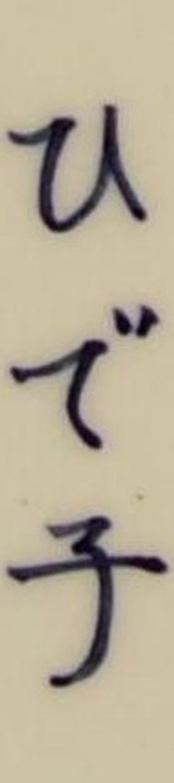ひで子
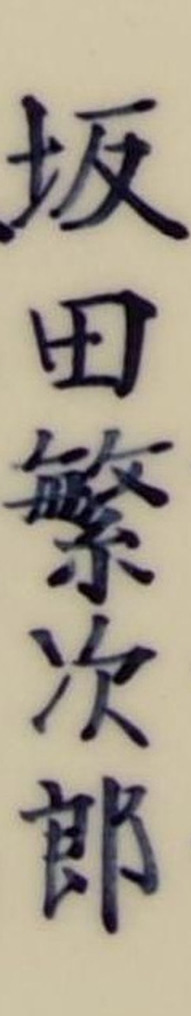坂田繁次郎
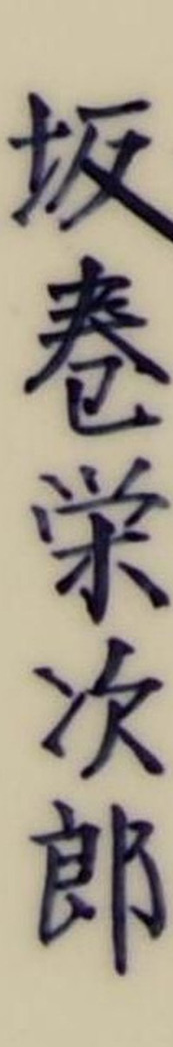坂巻栄次郎
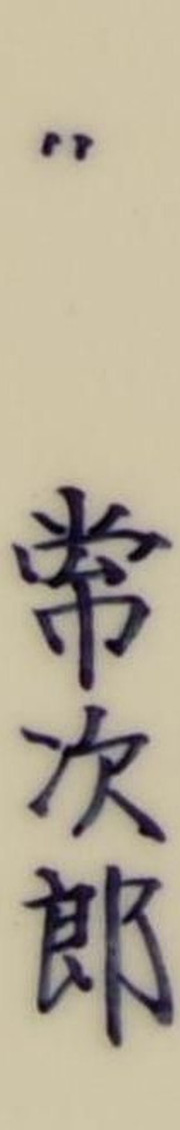常次郎
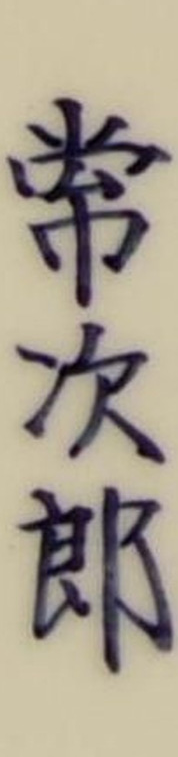常次郎
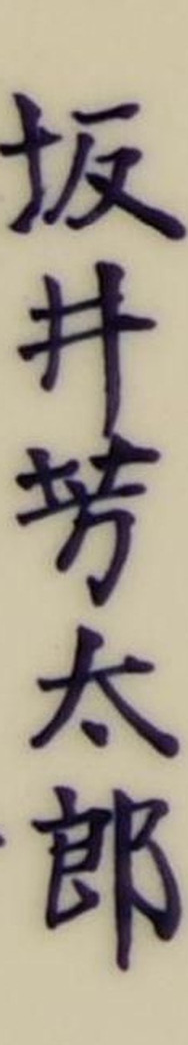坂井芳太郎
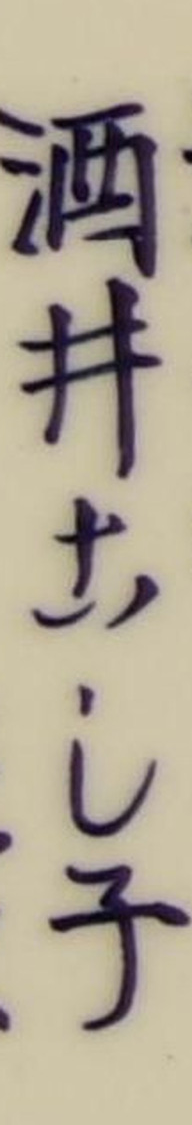酒井こし子

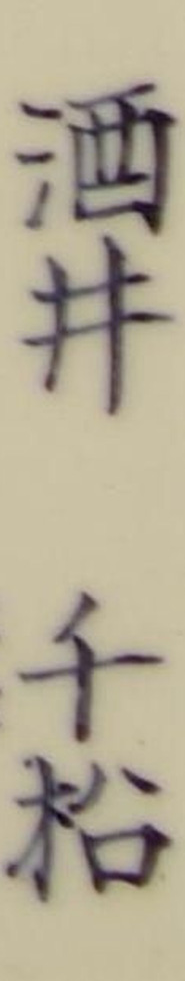酒井千松
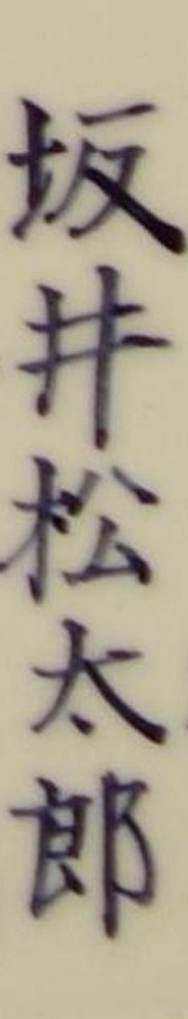坂井松太郎
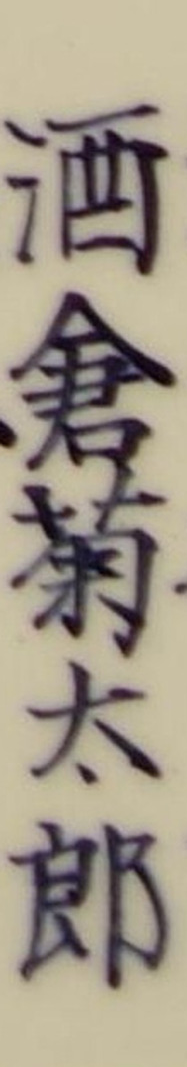酒倉菊太郎
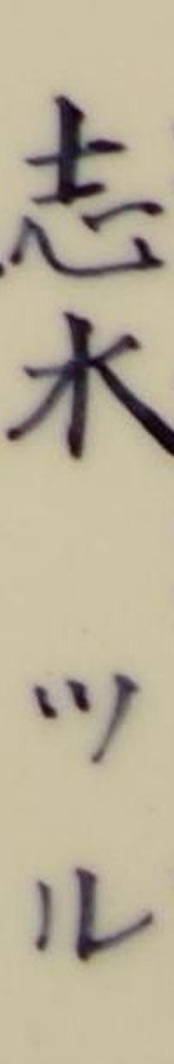志水ツル
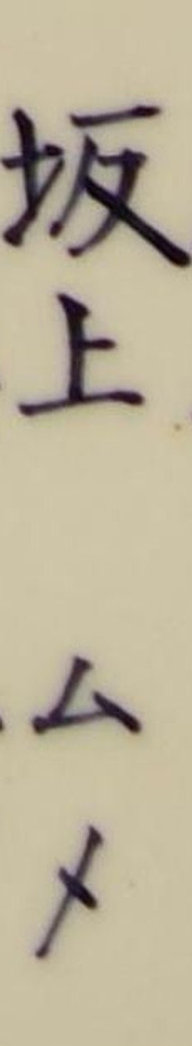坂上ムメ
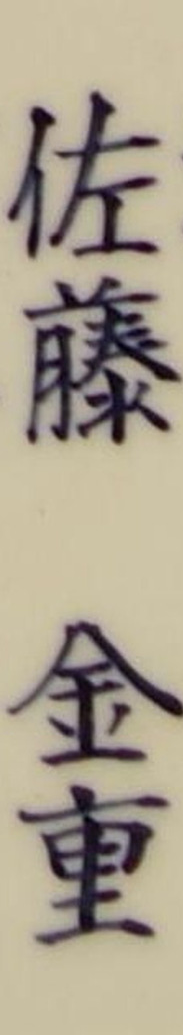佐藤金重
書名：E~L
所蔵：高野山金剛峯寺
